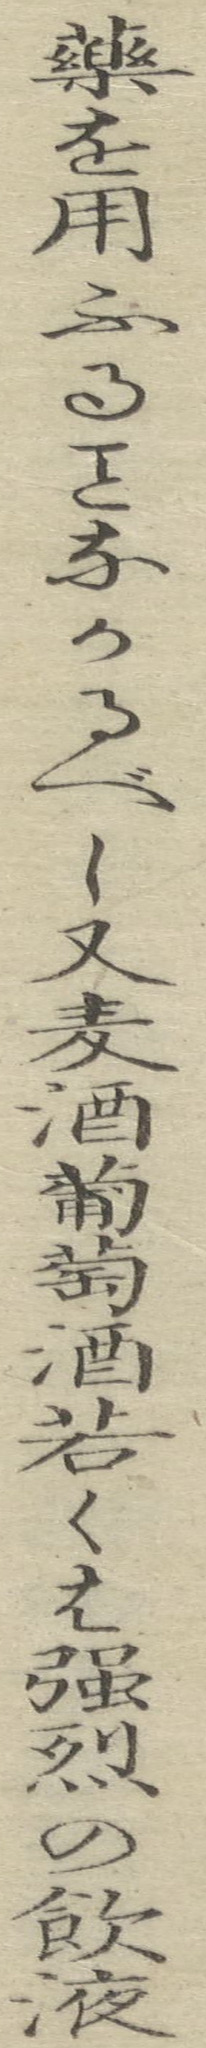藥を用ふることなかるべし又麦酒葡萄酒若くは強烈の飲液
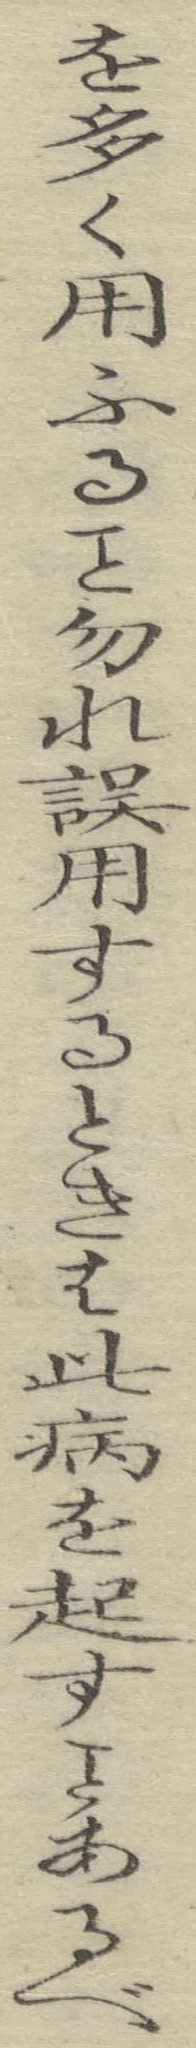を多く用ふること勿れ誤用するときは此病を起すことあるべ
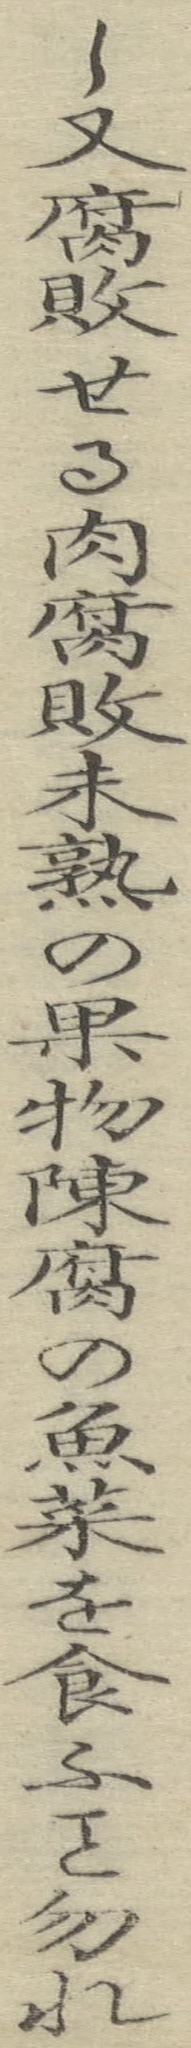し又腐敗せる肉腐敗未熟の果物陳腐の魚菜を食ふこと勿れ
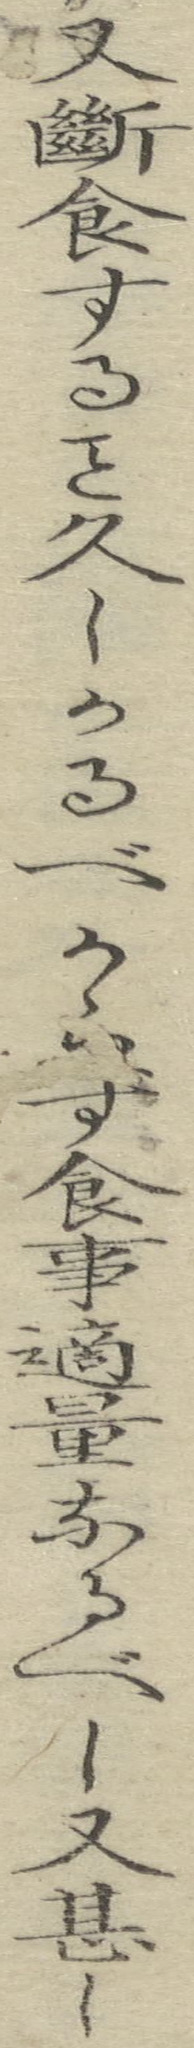又断食すること久しかるべからず食事適量なるべし又甚し
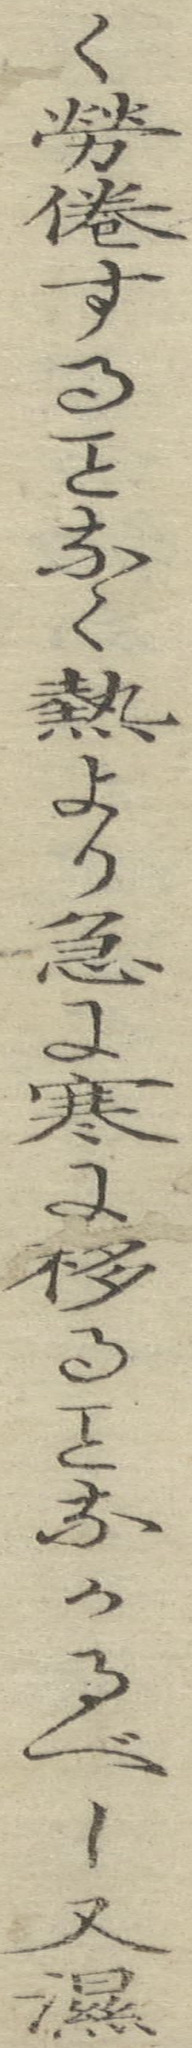く労倦することなく熱より急に寒に移ることなかるべし又濕
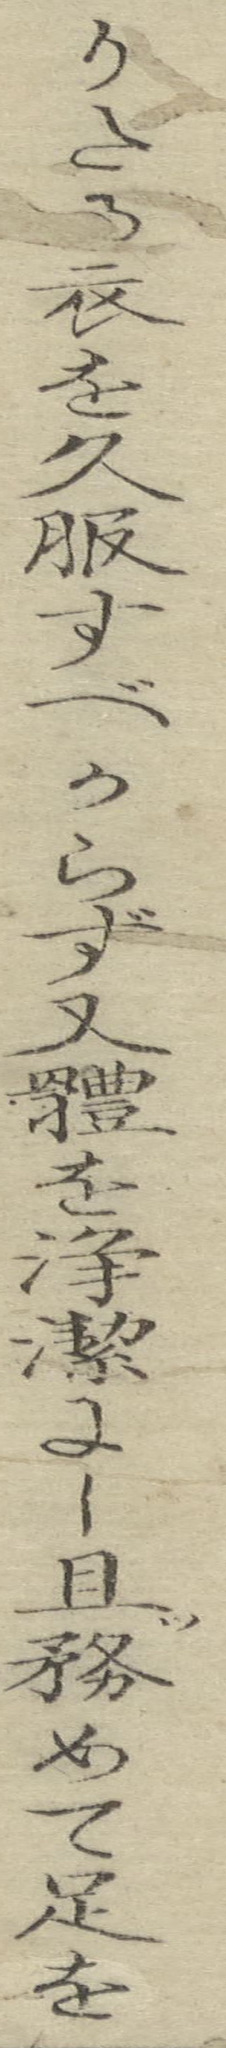りたる衣を久服すべからず又體を浄潔にし且努めて足を

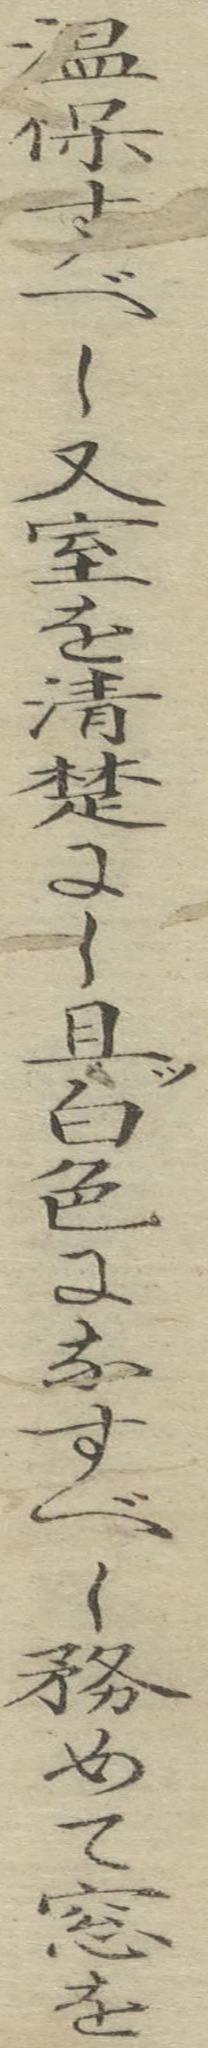温保すべし又室を清楚にし且白色になすべし努めて窓を
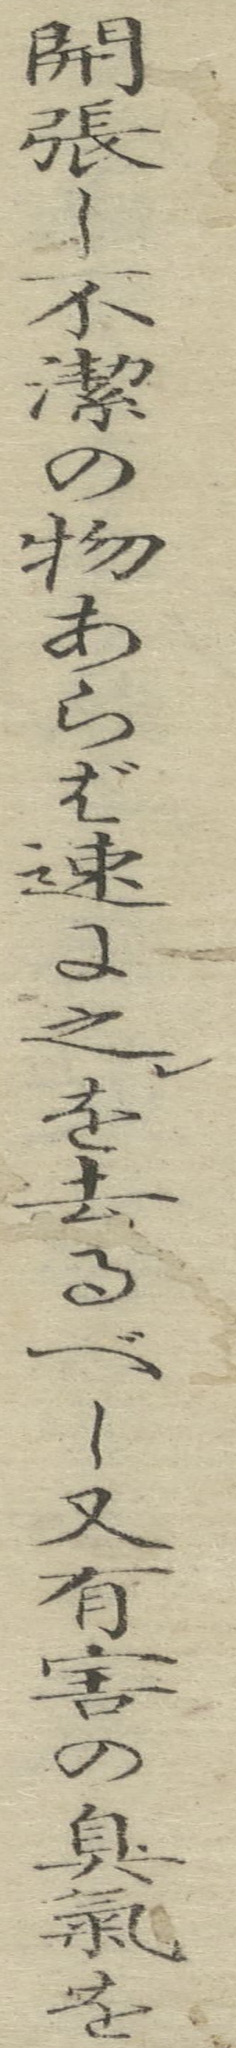開帳し不潔の物あらば速に之去るべし又有害の臭氣を
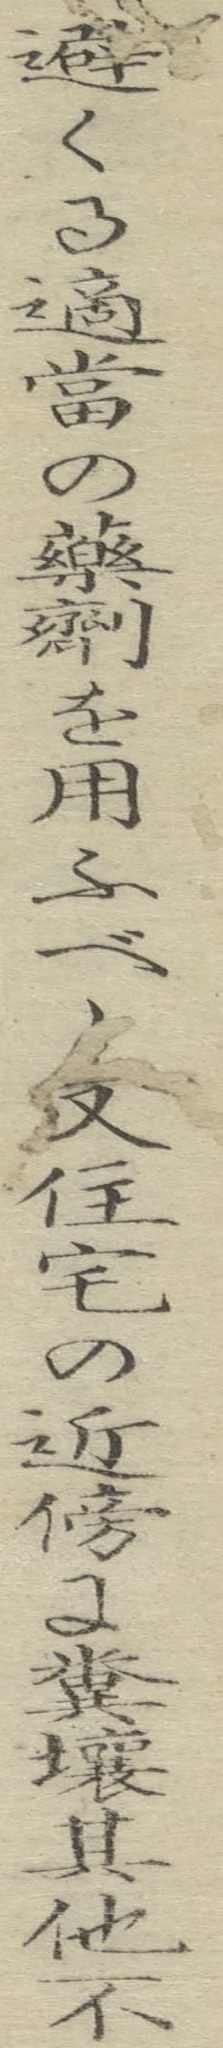避くる適當の藥劑を用ふるべし又住宅の近傍に糞壤其他不
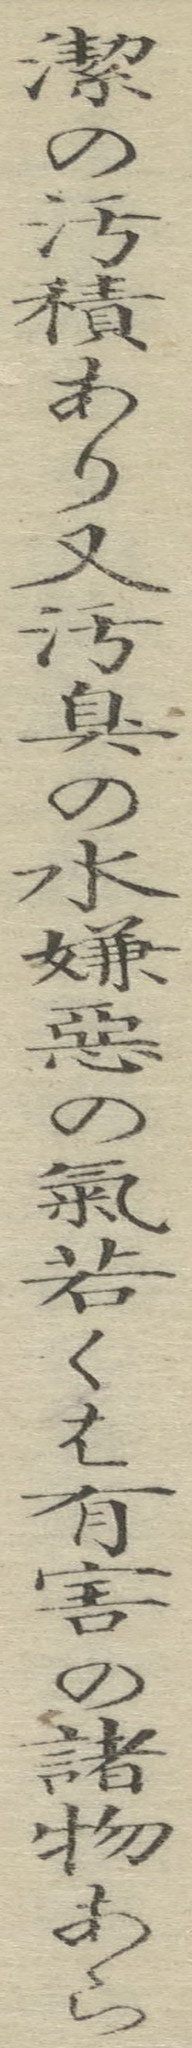潔の汚積あり又汚臭の水嫌惡の氣若くは有害の諸物あら
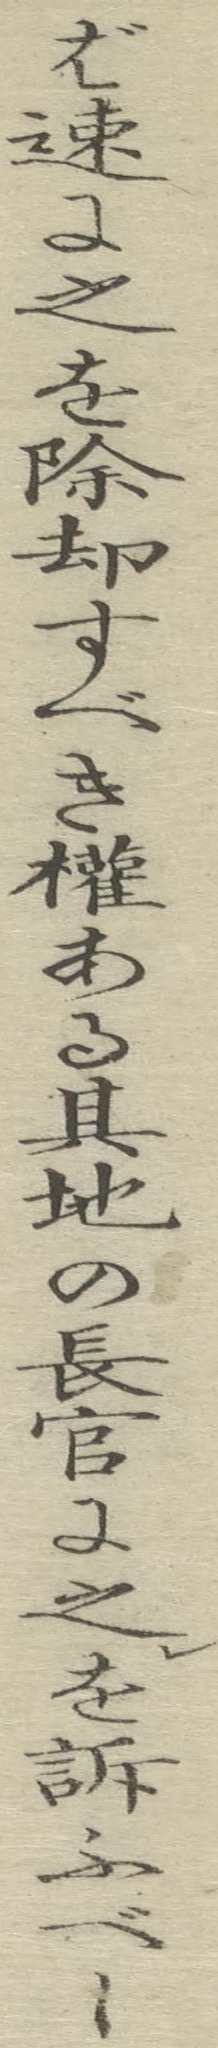ば速に之を除却すべき權ある其他の長官に之訴ふべし
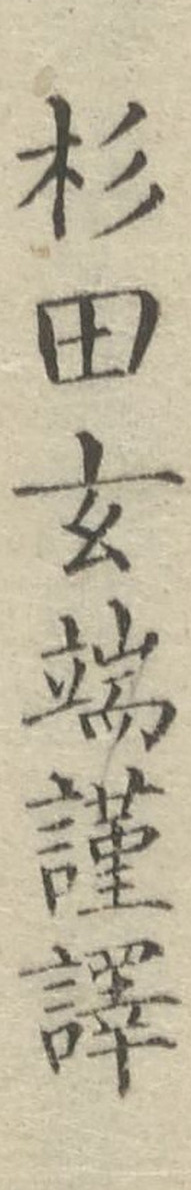杉田玄端謹譯
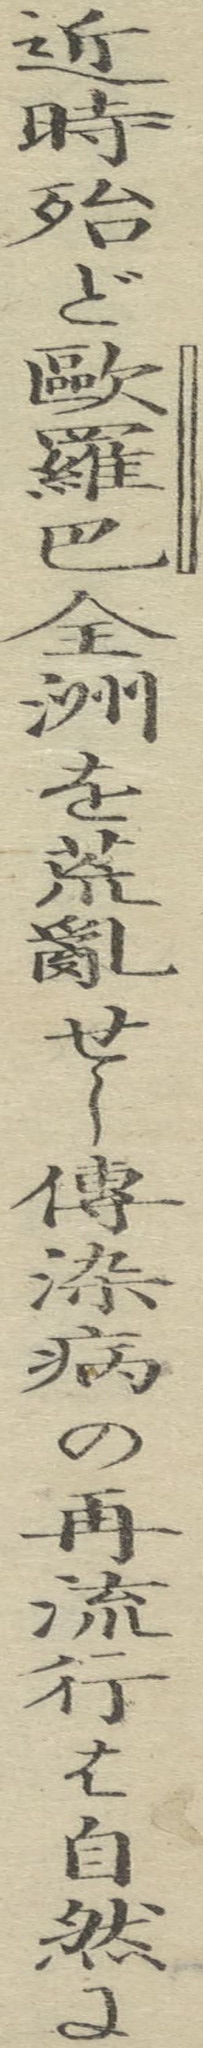近時殆ど欧羅巴全州を荒亂せし傅染病の再流行は自然に
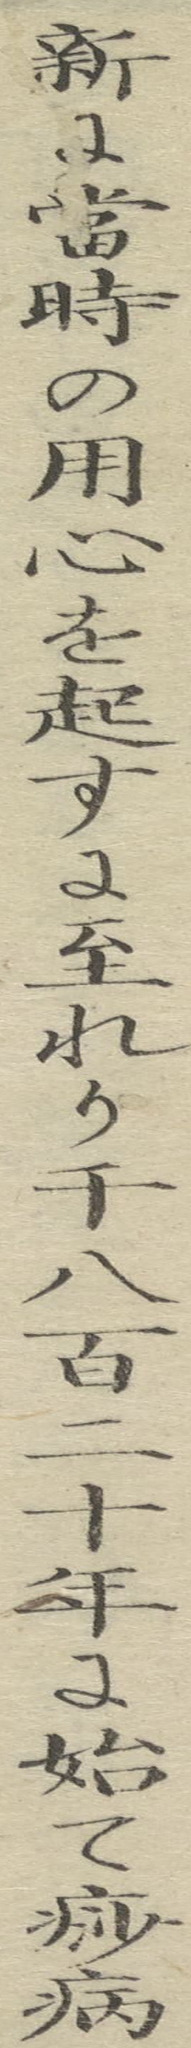新に當時の用心を起すに至れり千八百二十年に始て痧病
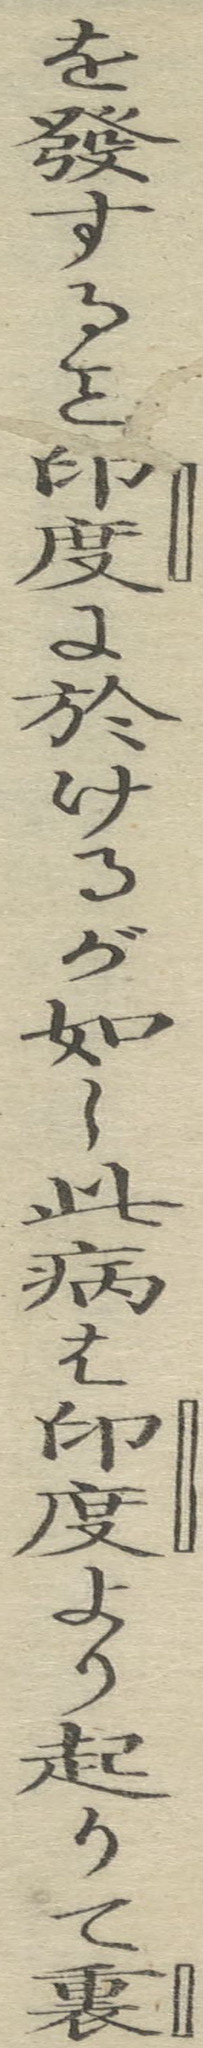を發すること印度に於けるが如し此病は印度より起りて裏
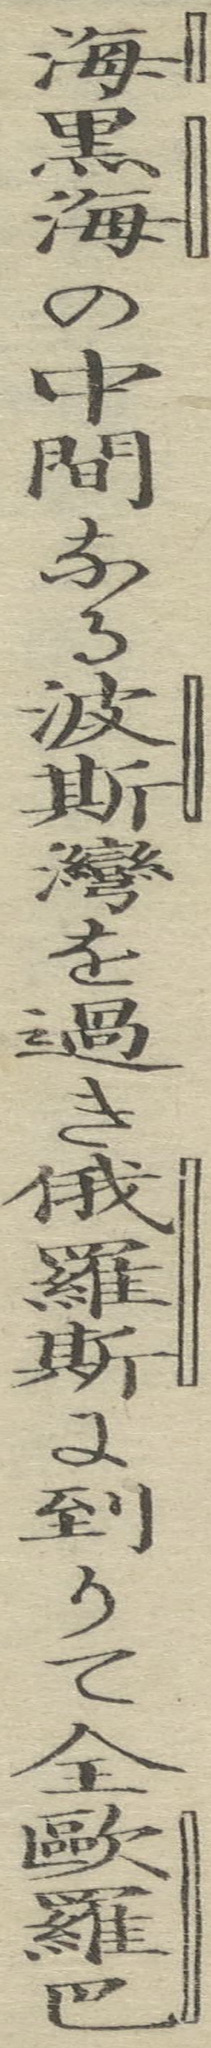海黒海の中間なる波斯彎を過き俄羅斯に到りて全欧羅巴
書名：官版疫毒預防説　全
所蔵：東京大学総合図書館 General Library in the University of Tokyo, JAPAN
